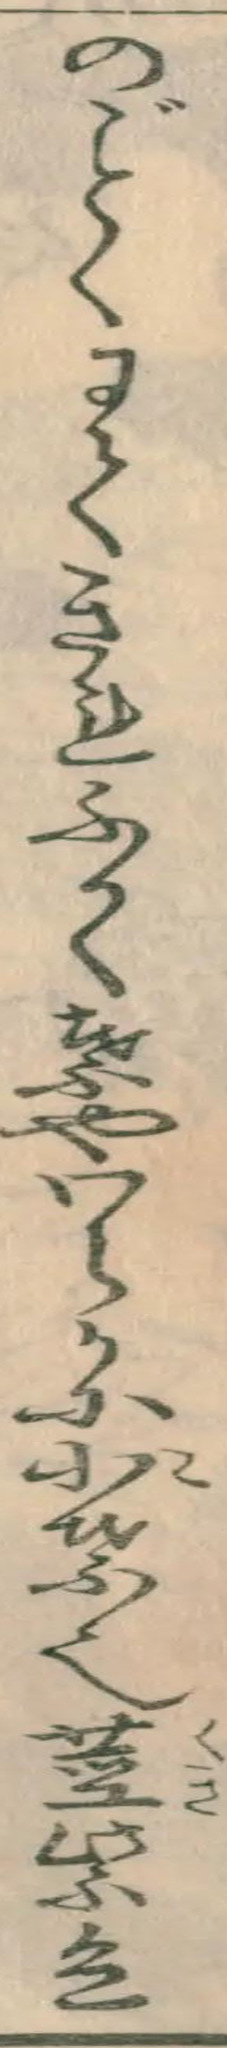のごとくにてきれふかく葉やわらかに小葉也茎紫色
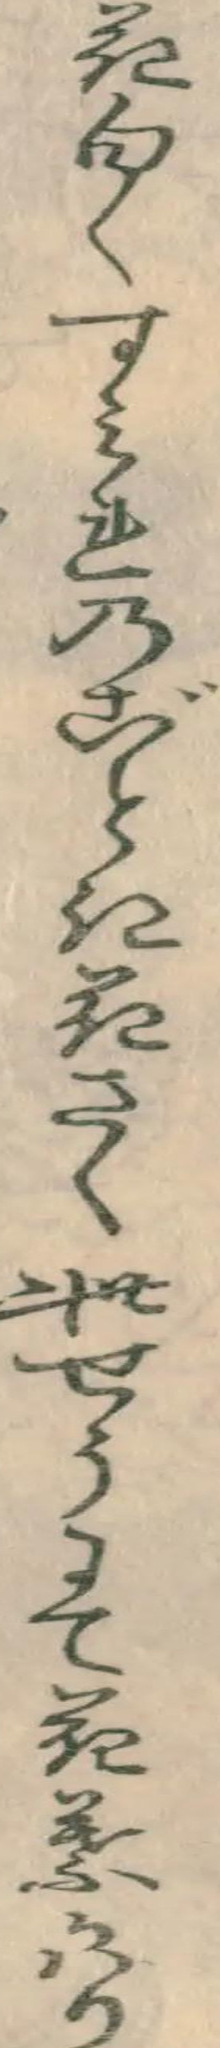花白くすみれのごとき花さく此せうにて花葉かはり
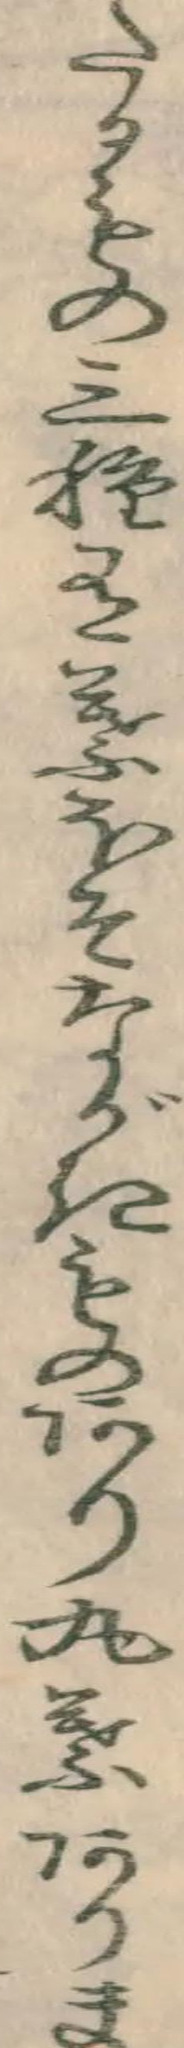たるもの三種有葉ほそながきものあり丸葉ありま
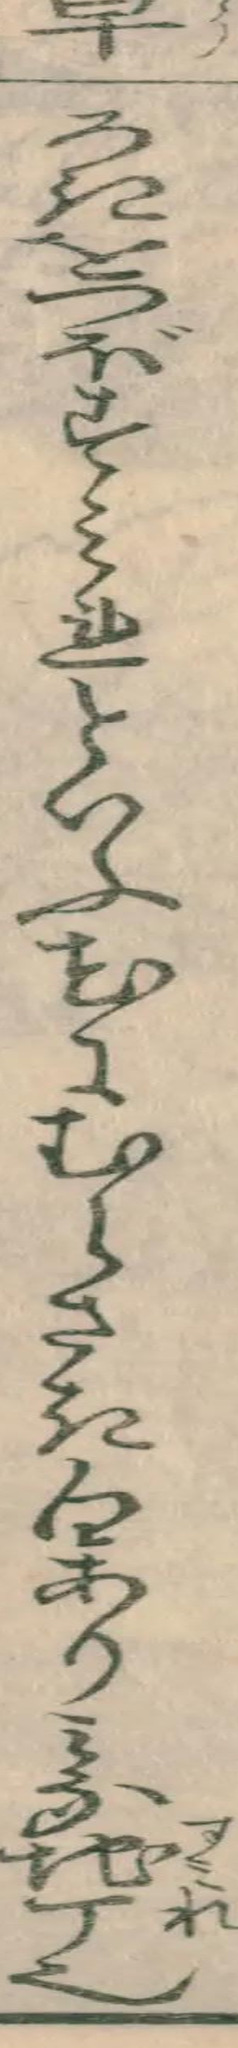ろきをつぼすみれといふ花にむらさき白ありみな地丁也
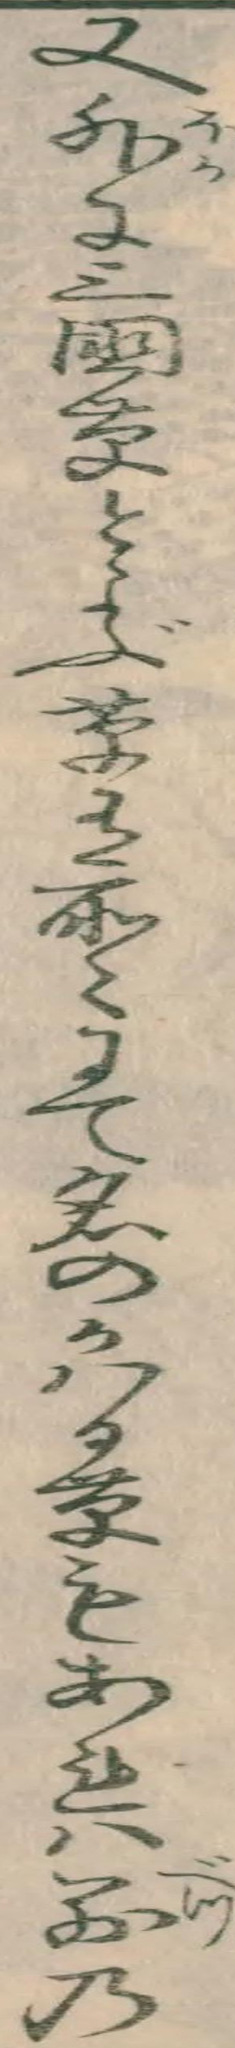又外に三国草とよぶ草有所々にて名のかはる草もあれは別の
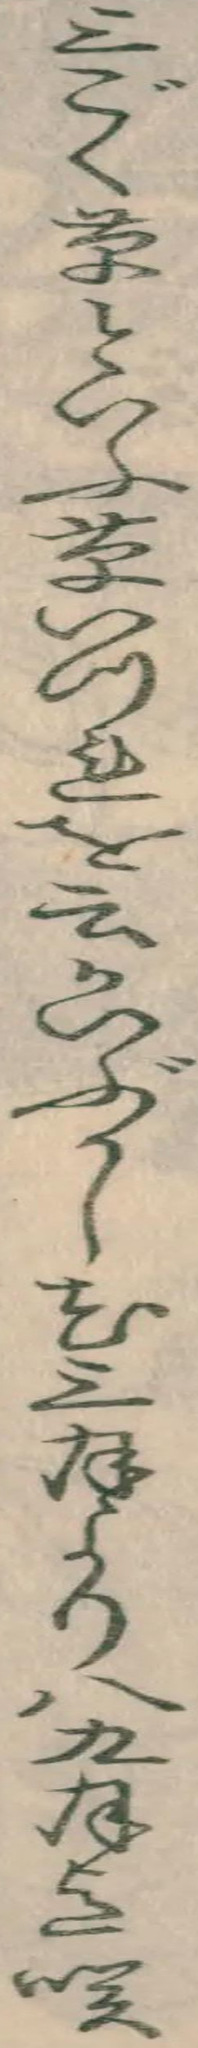三ごく草といふ草いつれを云かいぶかし花三月より八九月迄咲
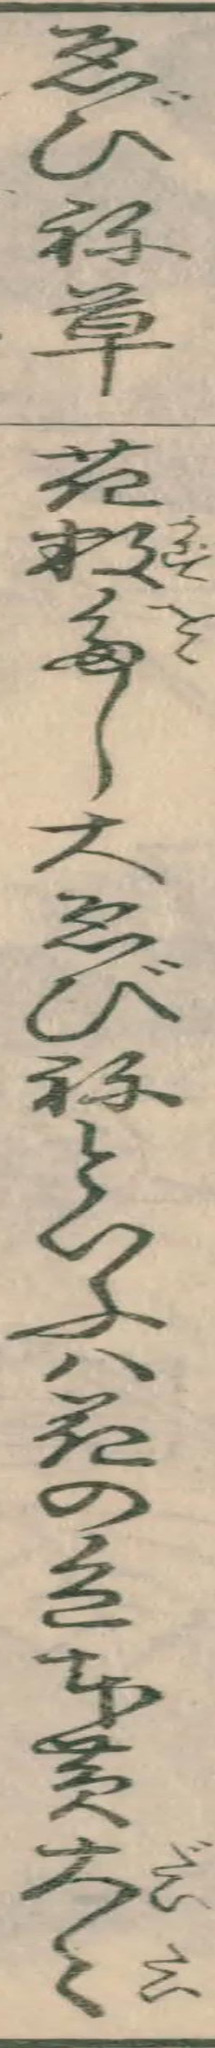花数多し大ゑびねといふは花の色本黄大々
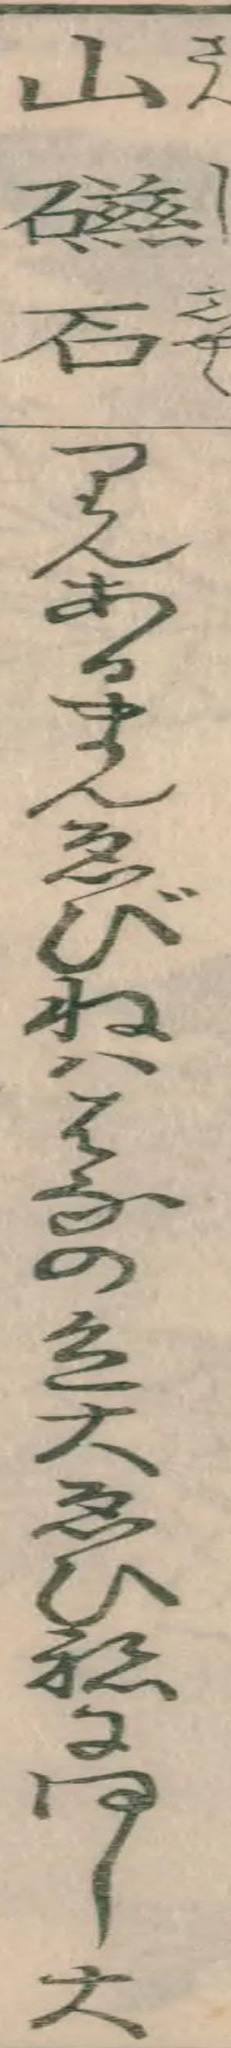りんあるまんゑびねははなの色大ゑひねに同し大
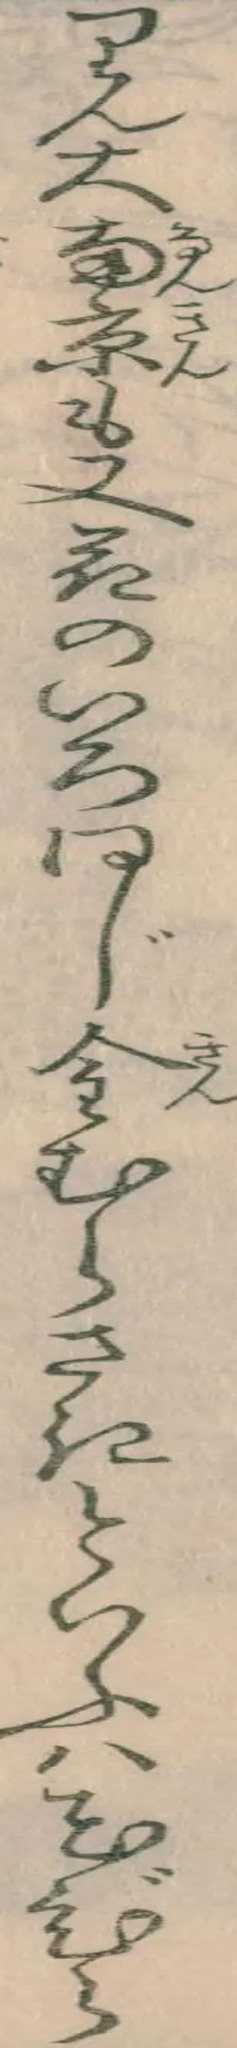りん大南京も又花のいろ同じ金むらさきといふは花びら
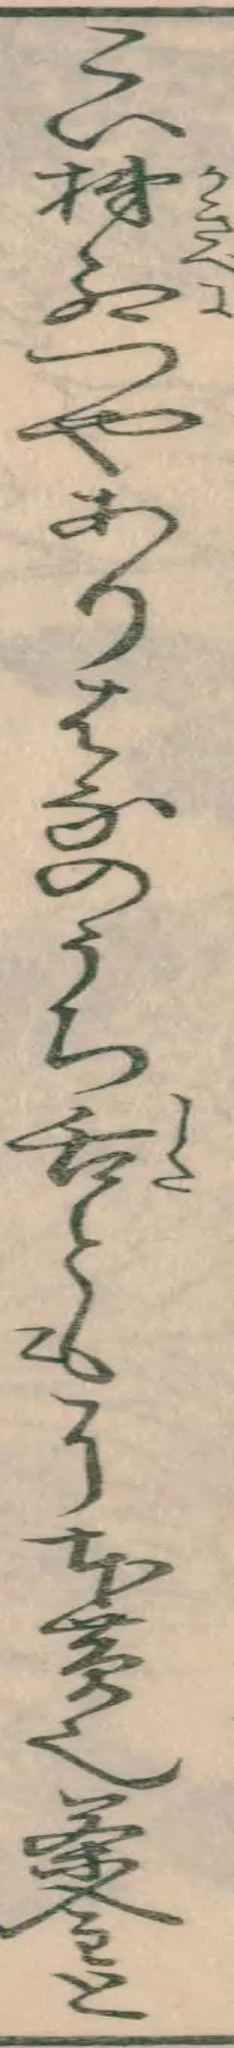こい柿紅つやありはなのうち舌ともに本黄也茶金と
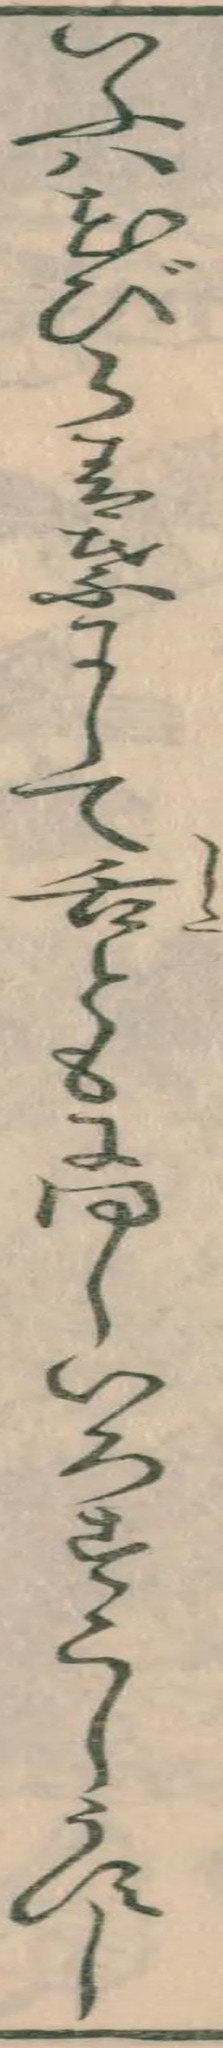いふは花びら青葉にして舌ともに同しいろすこしうすし
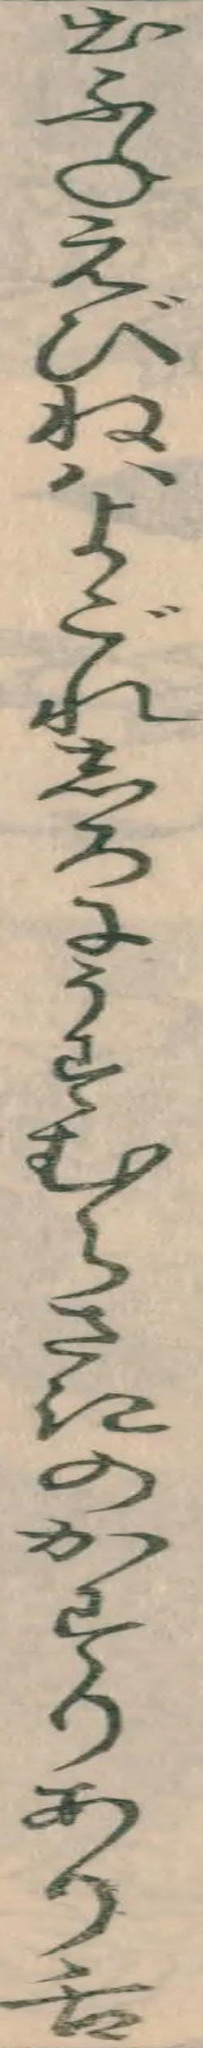出ふねえびねはよごれしろにうすむらさきのかすりあり舌
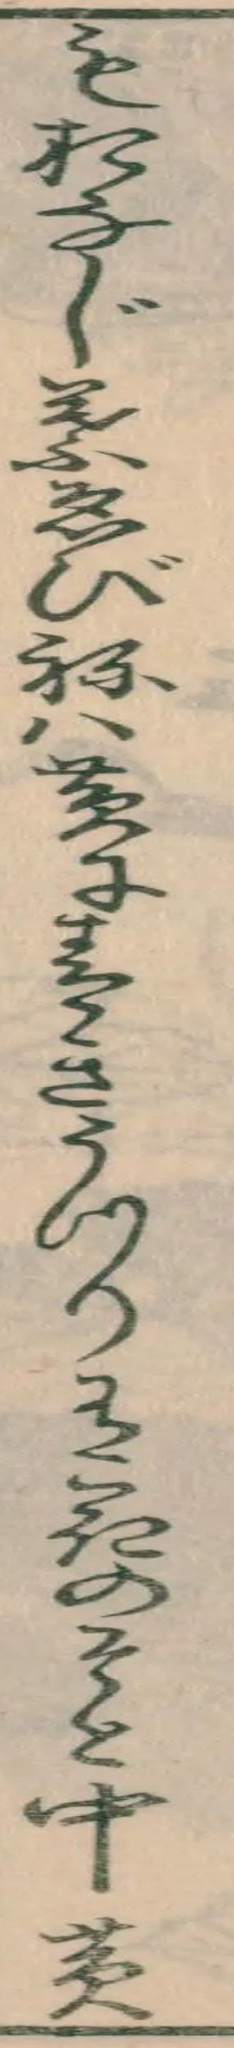もおなじ葉ゑびねは黄に青きうつり有花のそと中黄
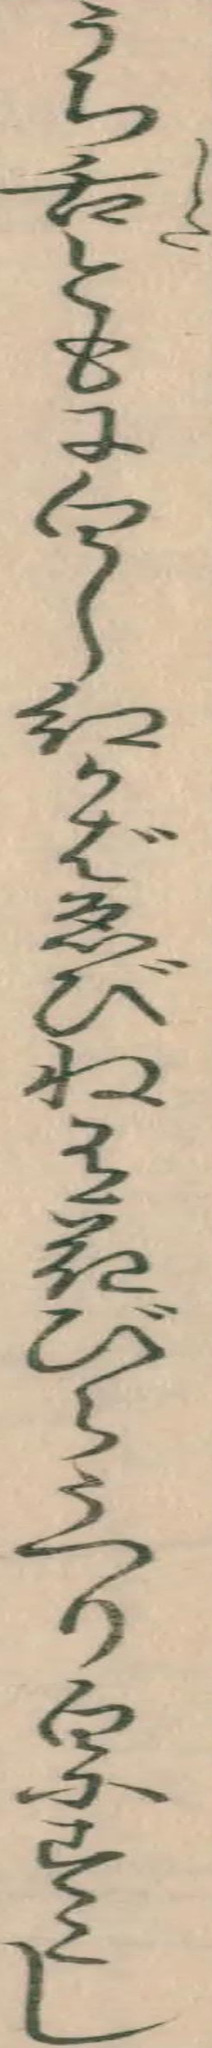うち舌ともに白し紅かばゑびね有花びらうつり白にすこし
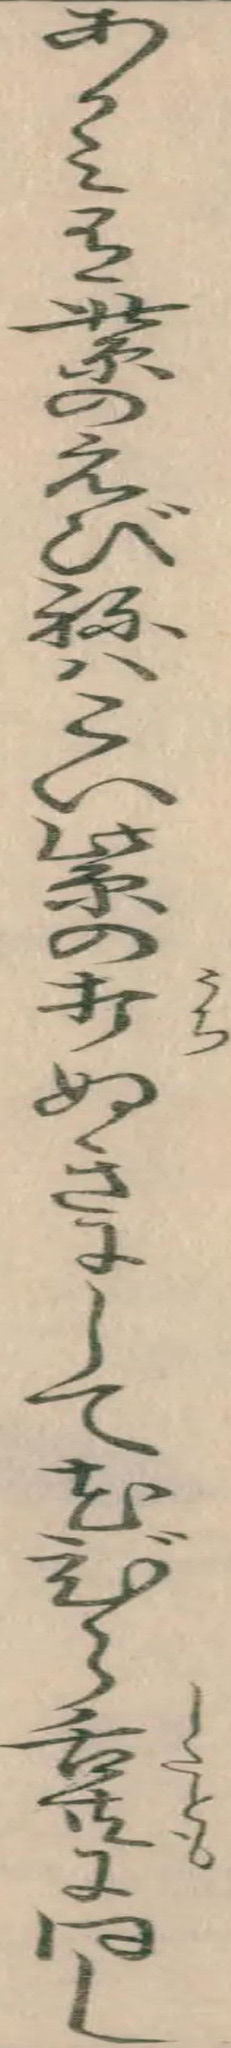あかみ有紫のえびねはこい紫の打ぬきにして花びら舌共に同し
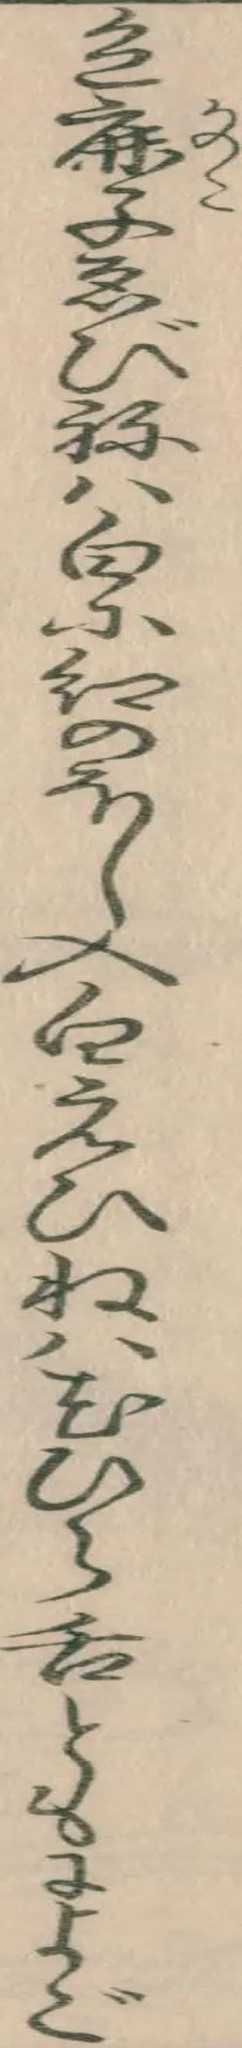色鹿子ゑびねは白に紅のほし入白えひねは花ひら舌ともによご
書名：畫本野山草. [5]
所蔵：国立国会図書館 National Diet Library, JAPAN
